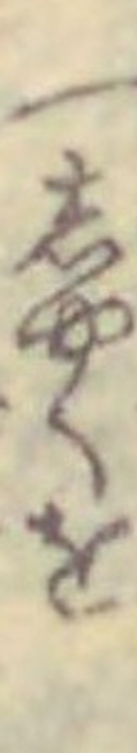しやくを
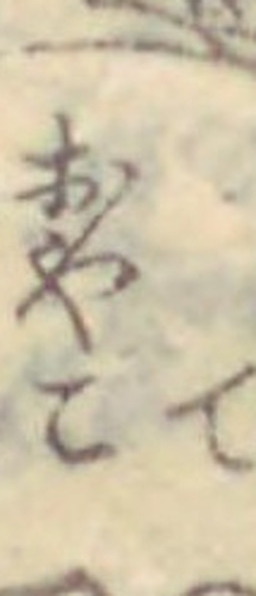おやこ
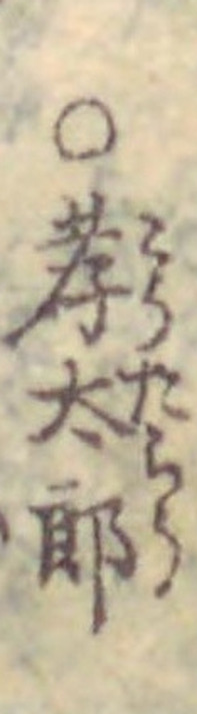○孝太郎
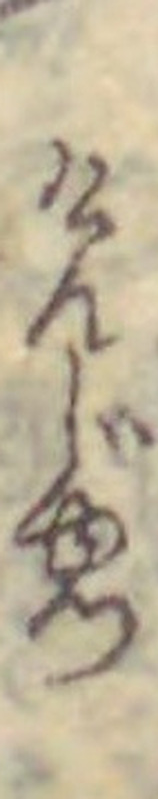けんじゆつ
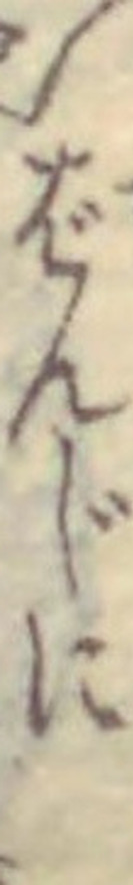ばんじに
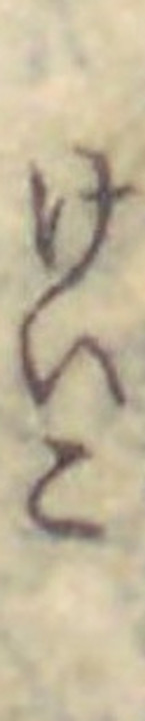けいこ
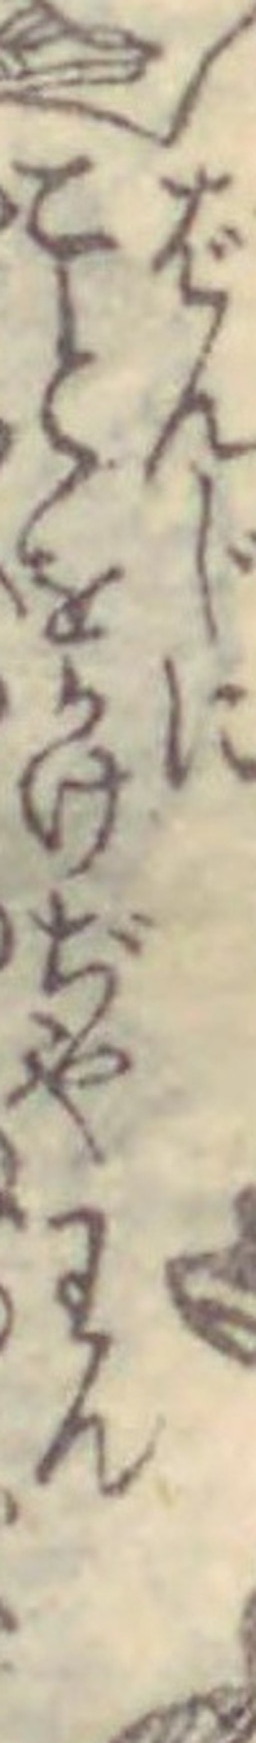ことをかけぢやわん
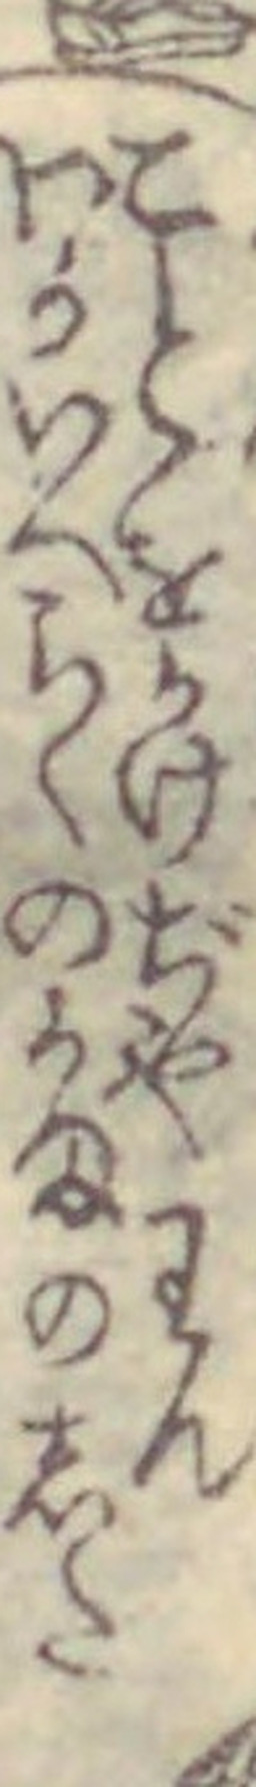わかいへらくのかまのした
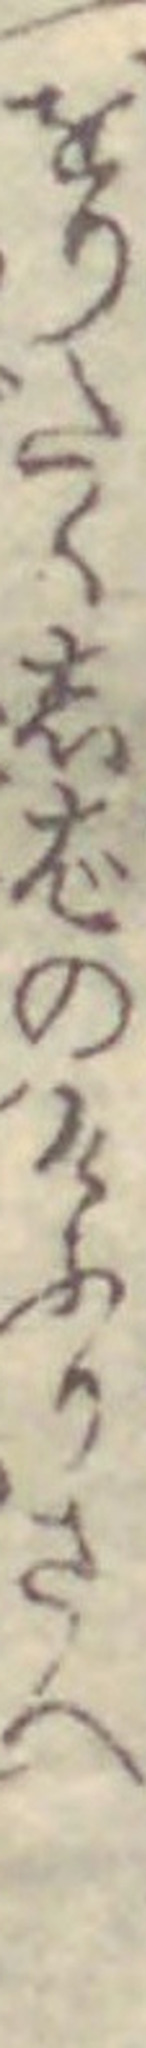をりたくしばのけふりさへ
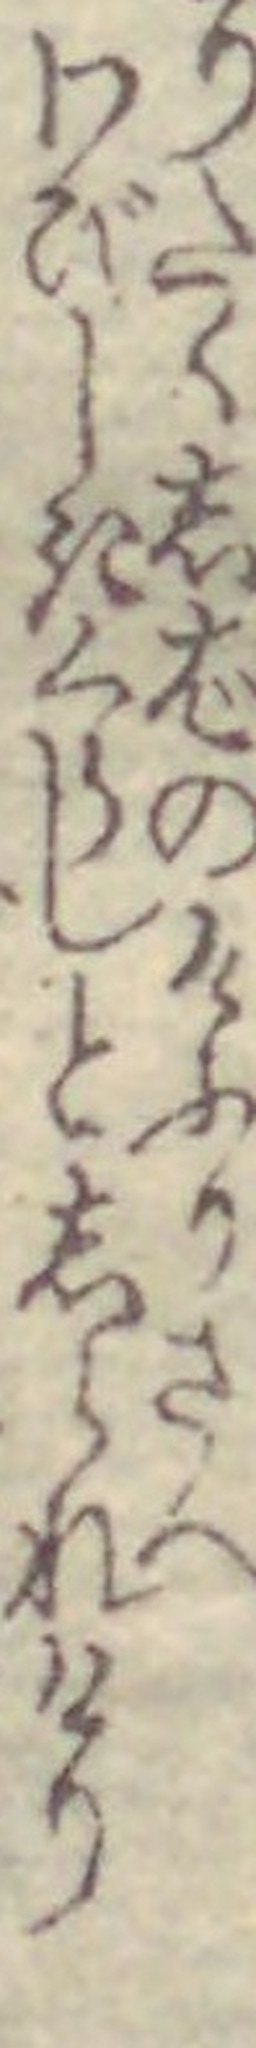わびしきくらしとしられけり
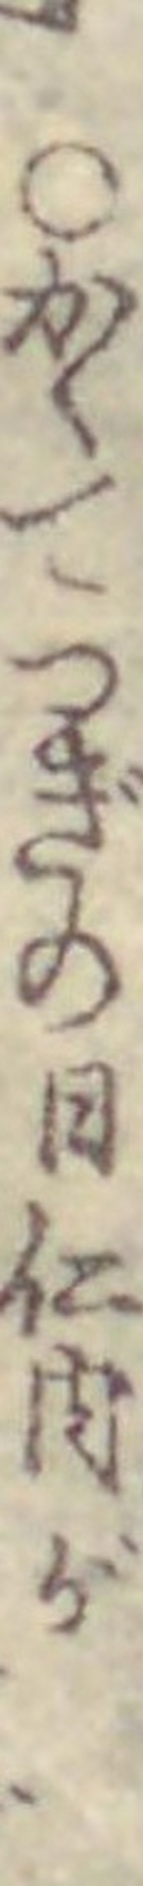○かくてつぎの日仁内が
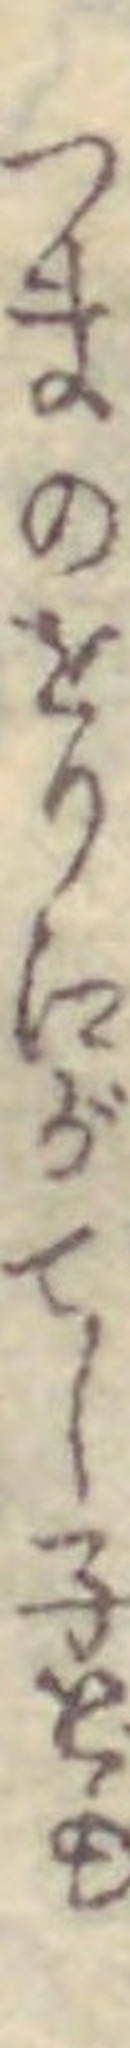つまのをり江がてし子ども
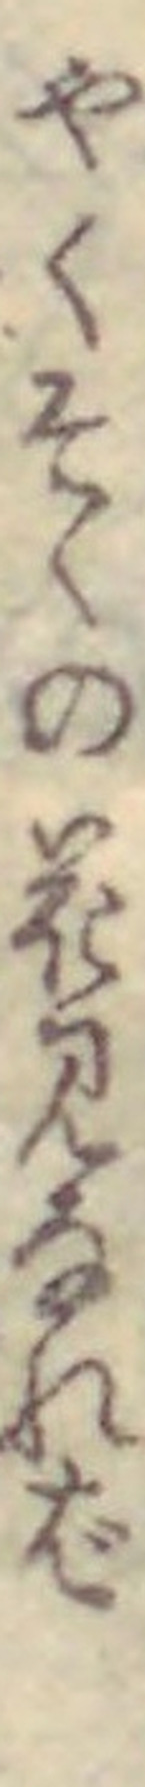やくそくの花見なれば
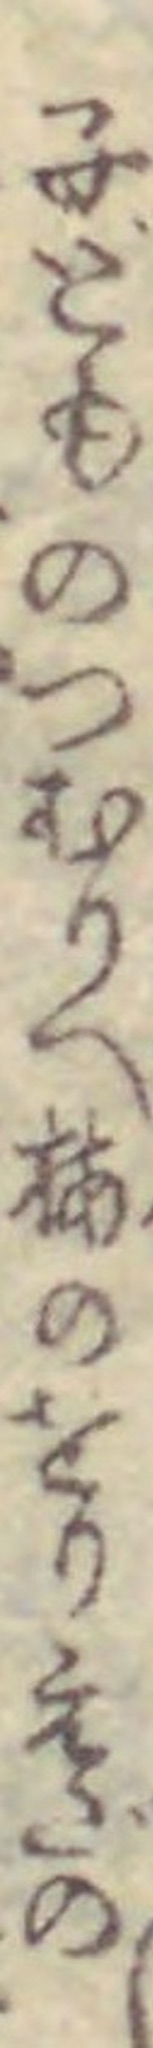子どものつむりへ梅のをりえだの
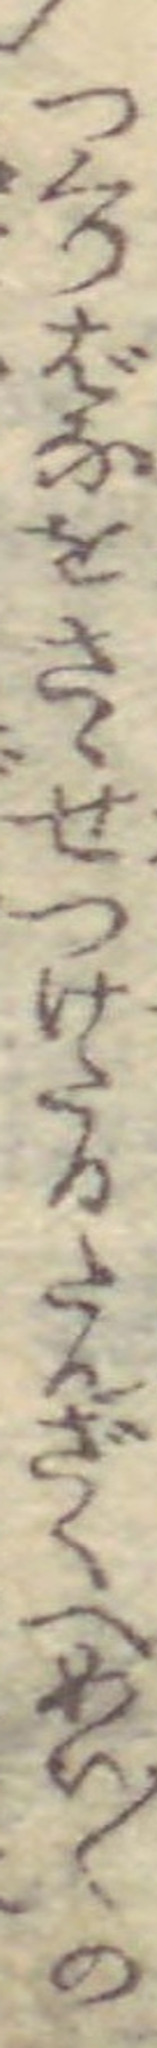つくりばなをさゝせつけたるたんざくへめい〳〵の
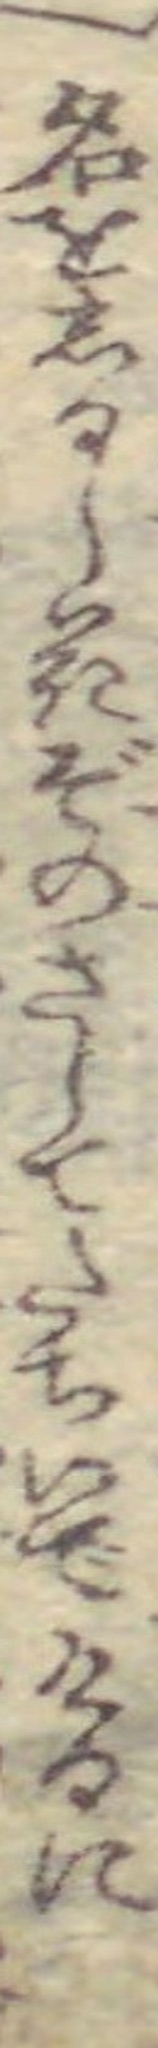名をしるし花ぞのさしてたちいでけるに
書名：八ツ目鱣因縁物語 3巻
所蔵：国立国会図書館 National Diet Library, JAPAN
